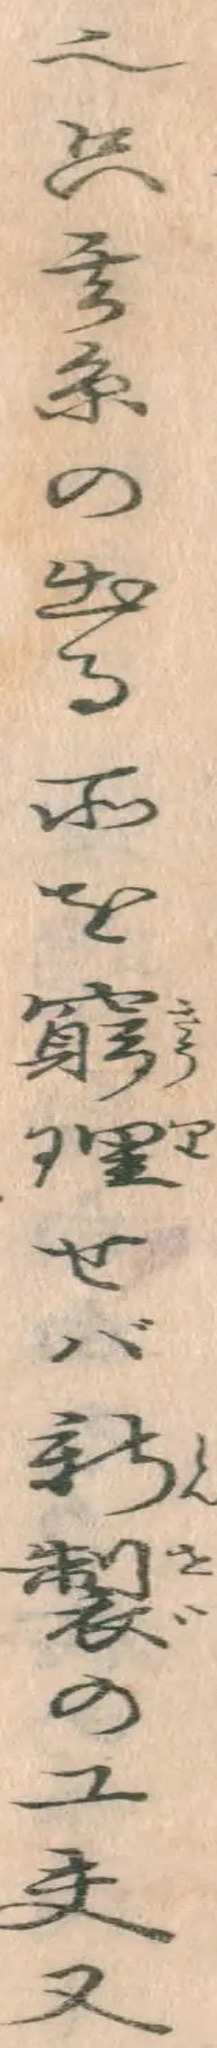也只其糸の出る所を窮理せば新製の工夫又
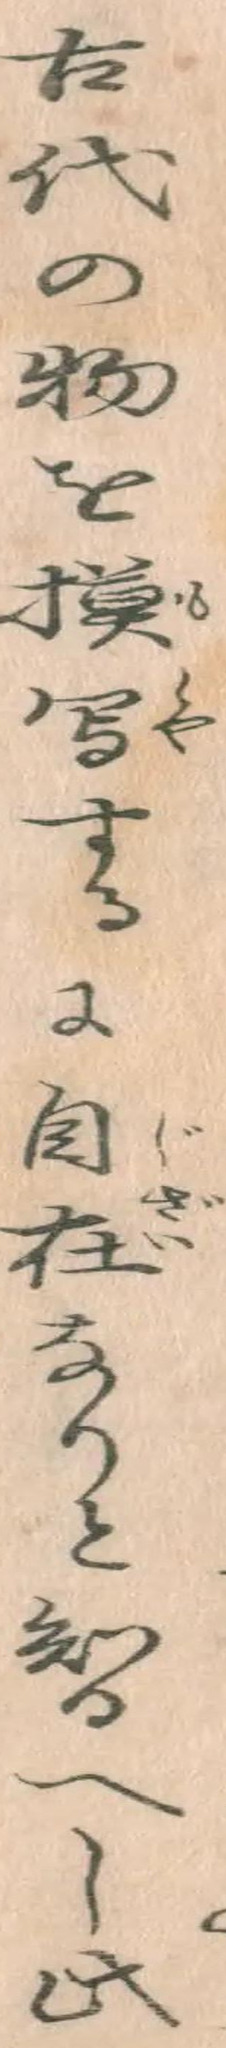古代の物を模写するに自在なりと知るへし此
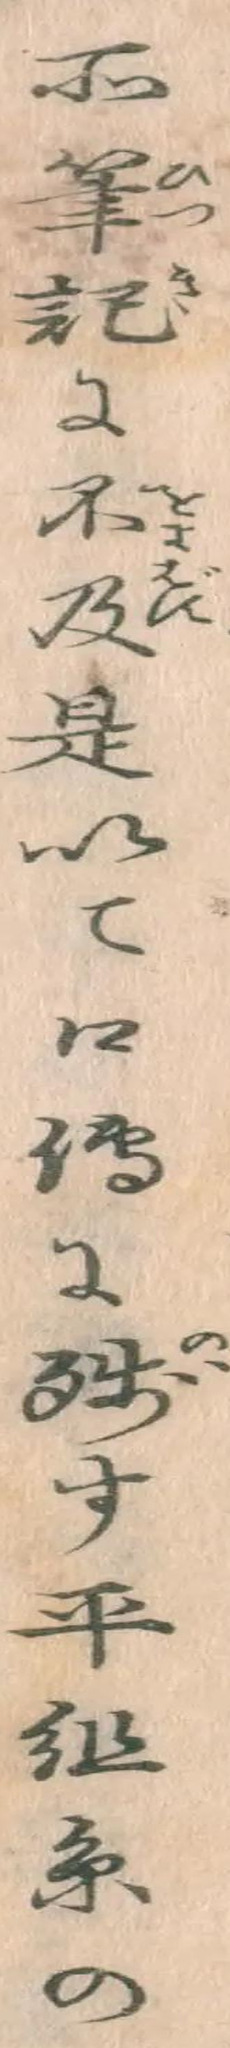所筆記に不及是以て口伝に残す平組糸の
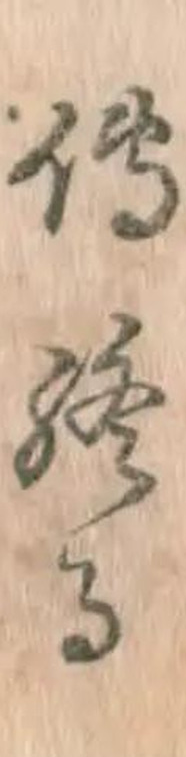伝終る
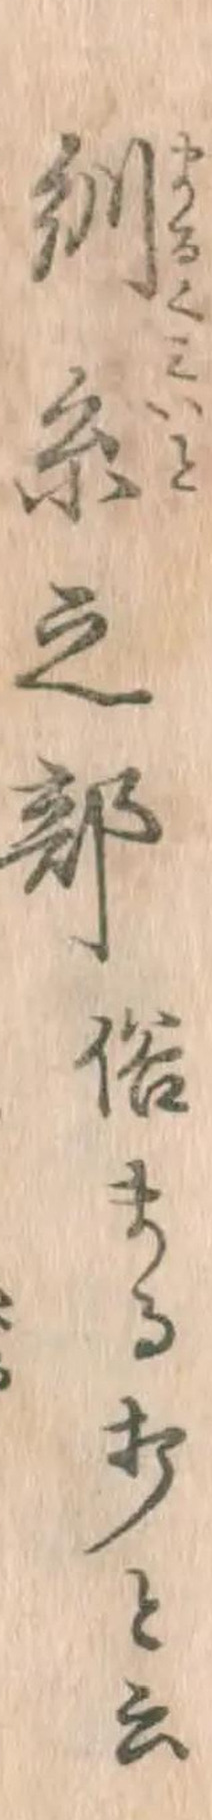紃糸之部俗まる打と云
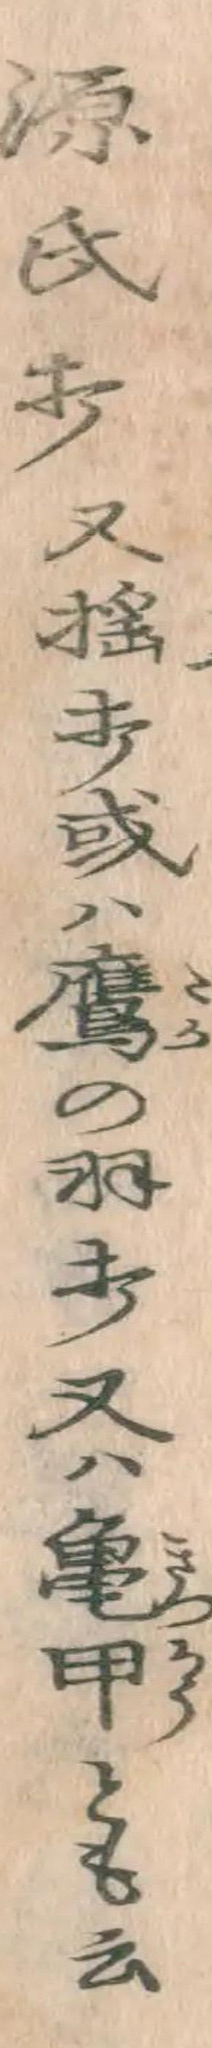源氏打又揺打或は鷹の羽打又は亀甲とも云

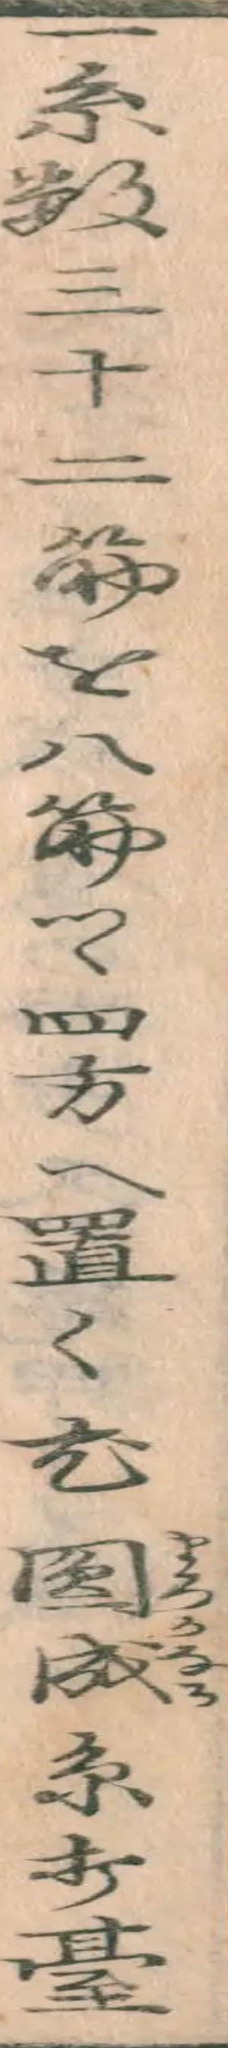一糸数三十二筋を八筋つゝ四方へ置く尤円成糸打台
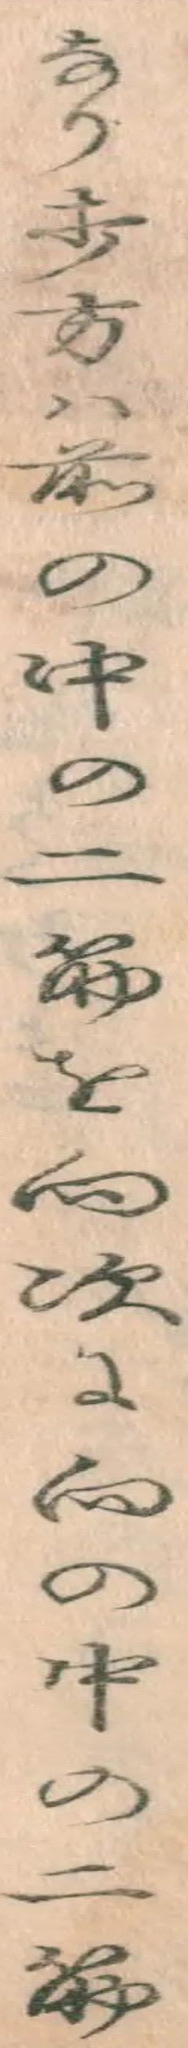なり打方は前の中の二筋を向次に向の中の二筋
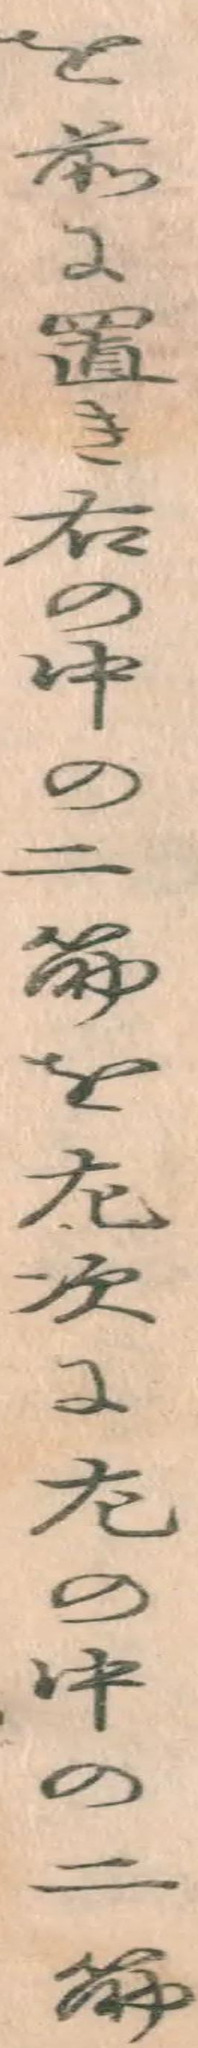を前に置き右の中に二筋を左次に左の中の二筋
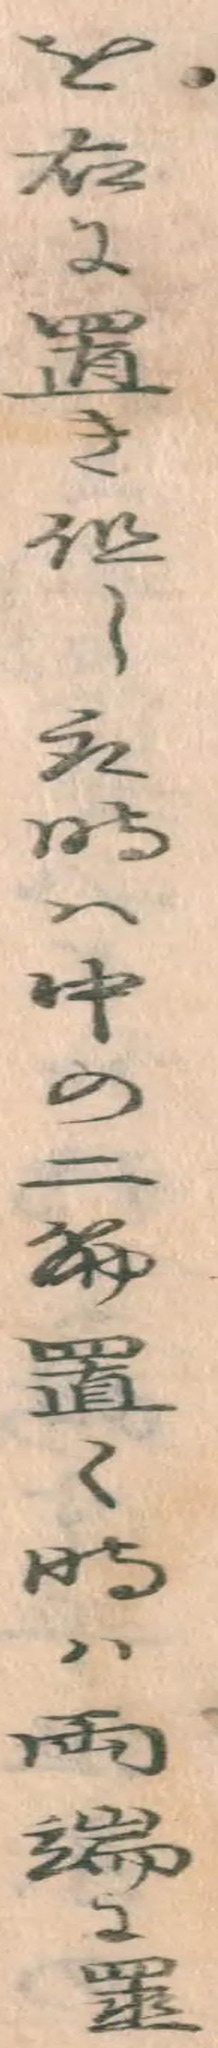を右に置き但し取時は中の二筋置く時は両端に置
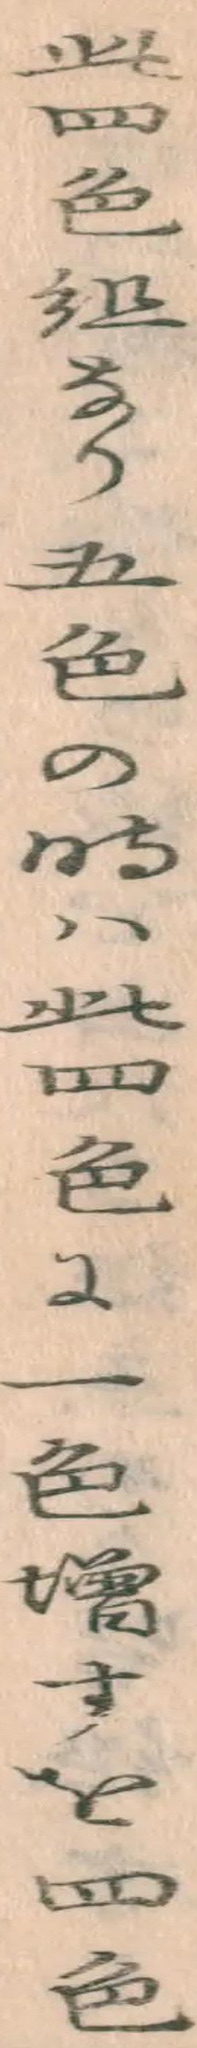此四色組なり五色の時は此四色に一色増すを四色
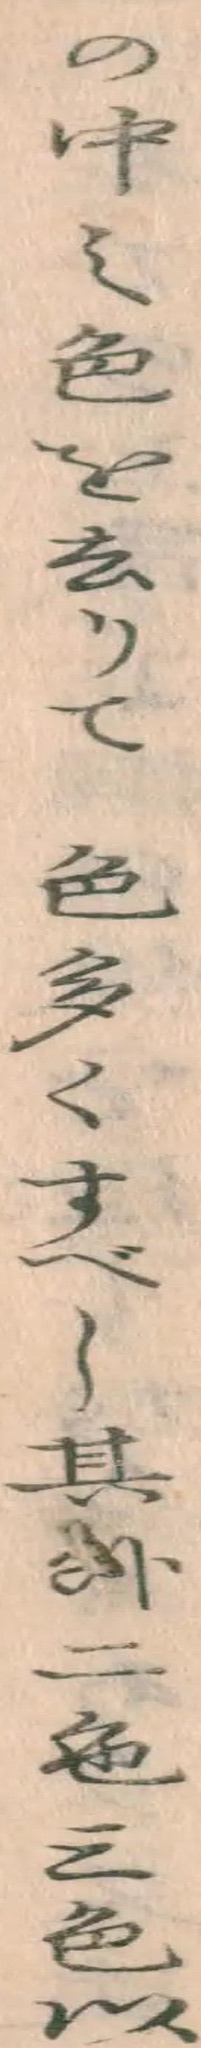の中之色を去りて色多くすべし其外二色三色以
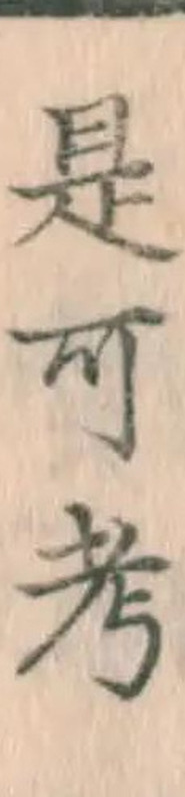是可考
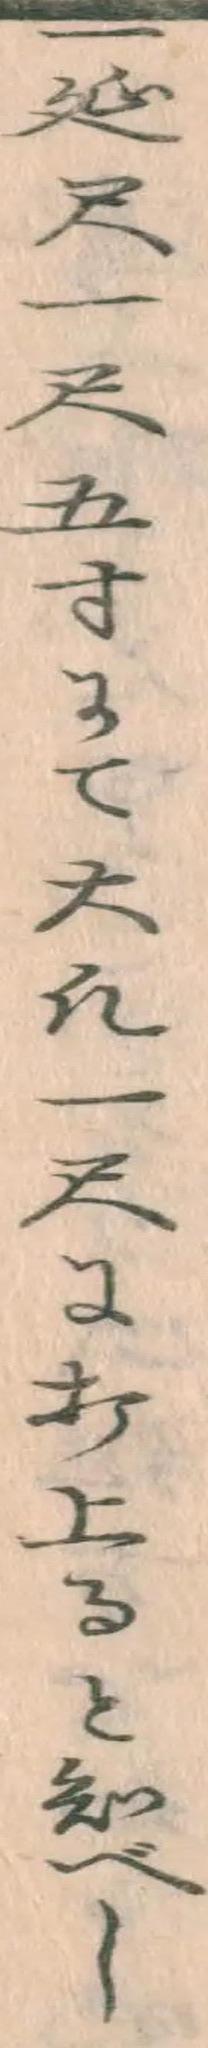一延尺一尺五寸にて大凡一尺に打上ると知べし
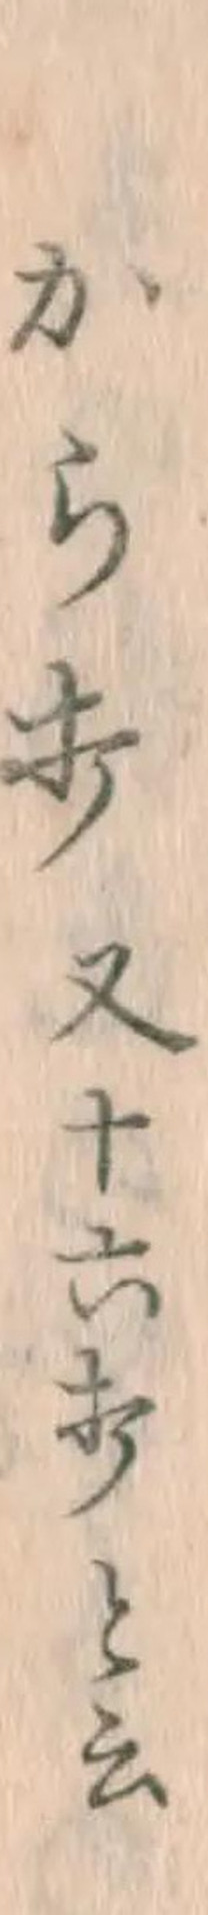から打又十六打と云
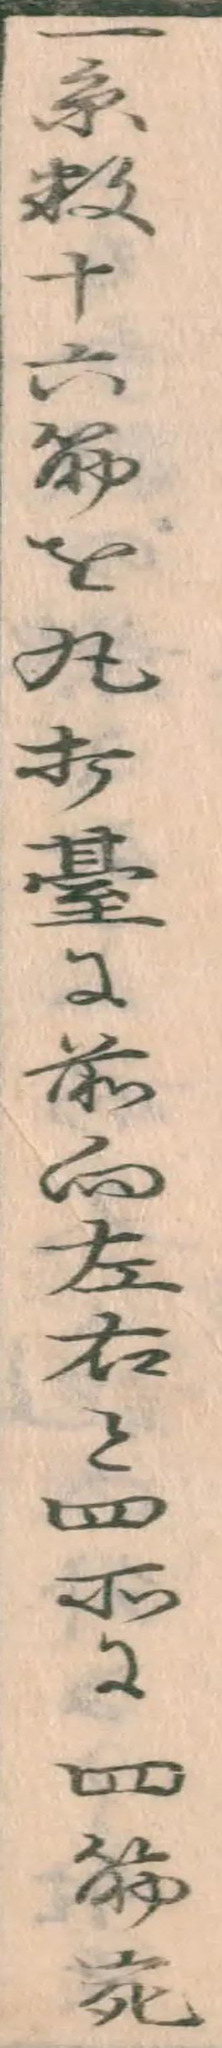一糸数十六筋を丸打台に前向左右と四所に四筋宛
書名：機織彙編 5巻. [2]
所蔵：国立国会図書館 National Diet Library, JAPAN
